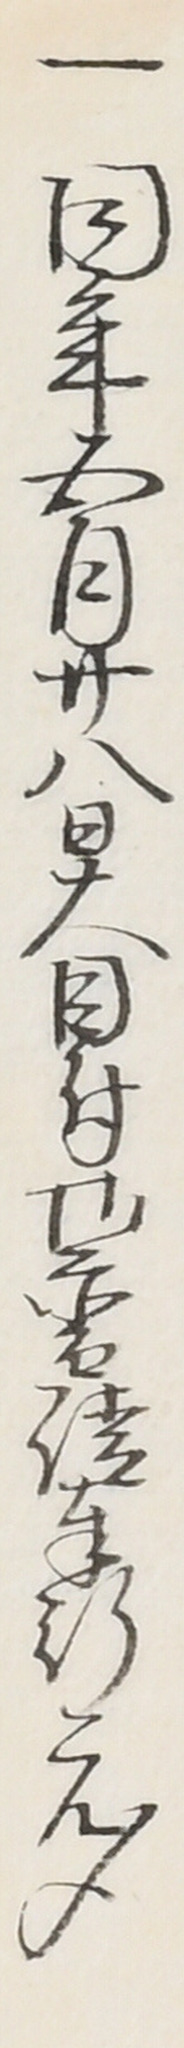一同年五月廿八日大目付御普請奉行元〆
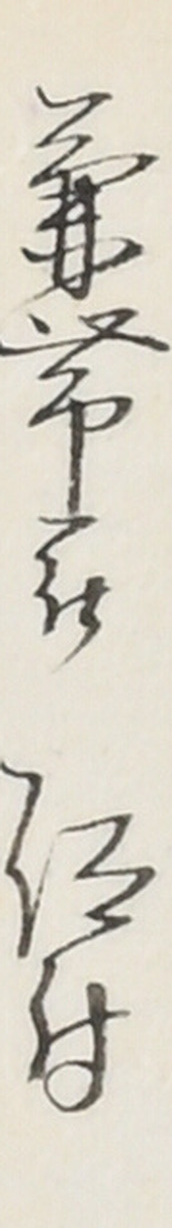兼帯被仰付
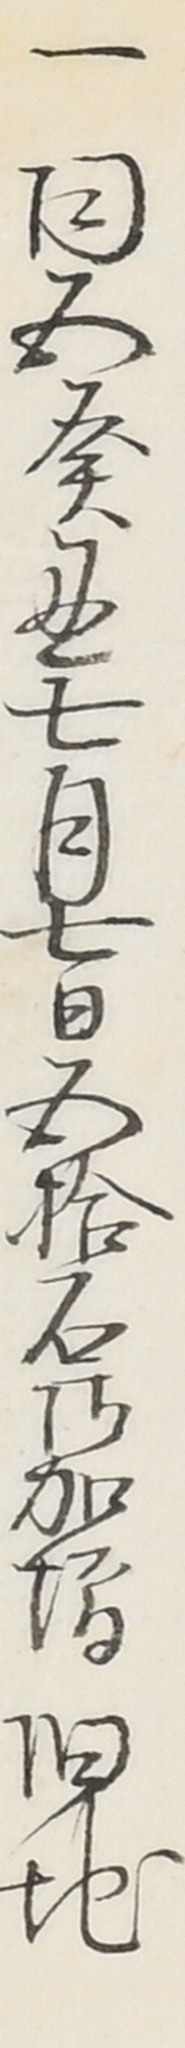一同五癸丑七月七日五拾石御加増旧地
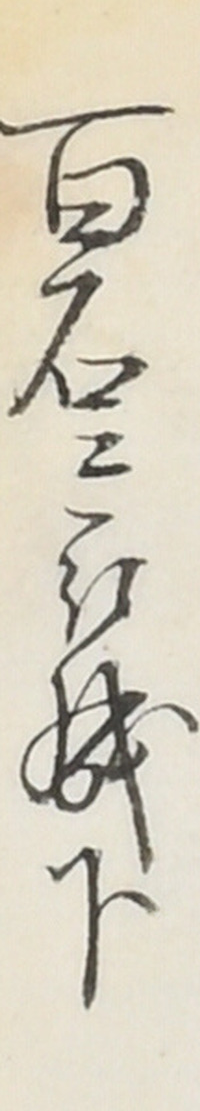百石ニ被成下
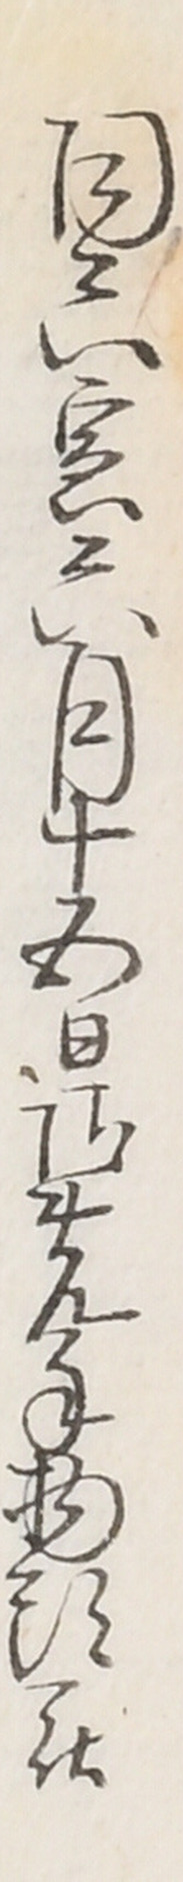一同六寅六月十五日御先手物頭被
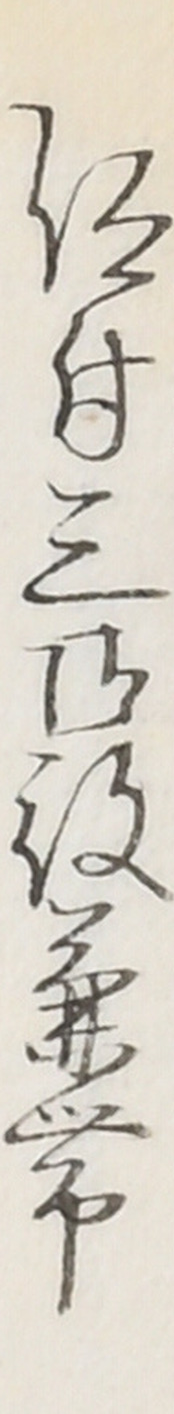仰付三御役兼帯
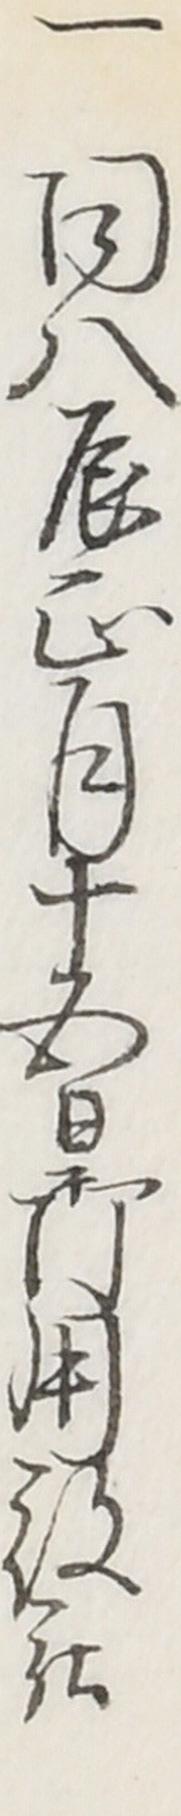一同八辰正月十五日御用役被
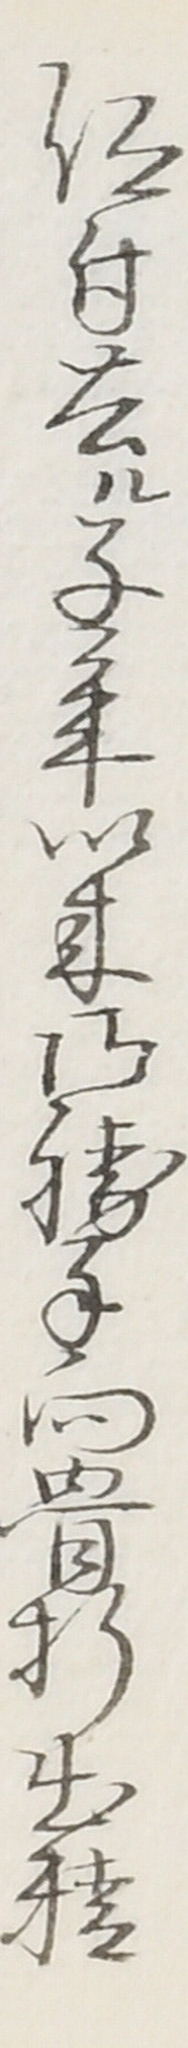仰付去ル子年以来御勝手向骨折出精
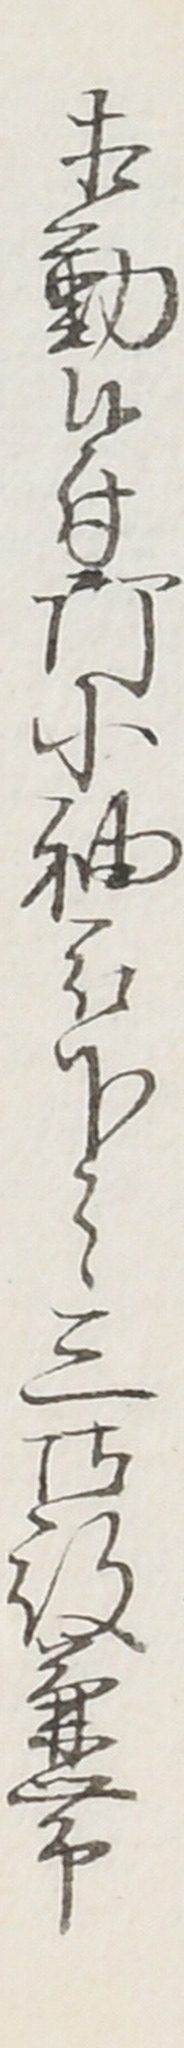相勤候付御小袖被下之三御役兼帯
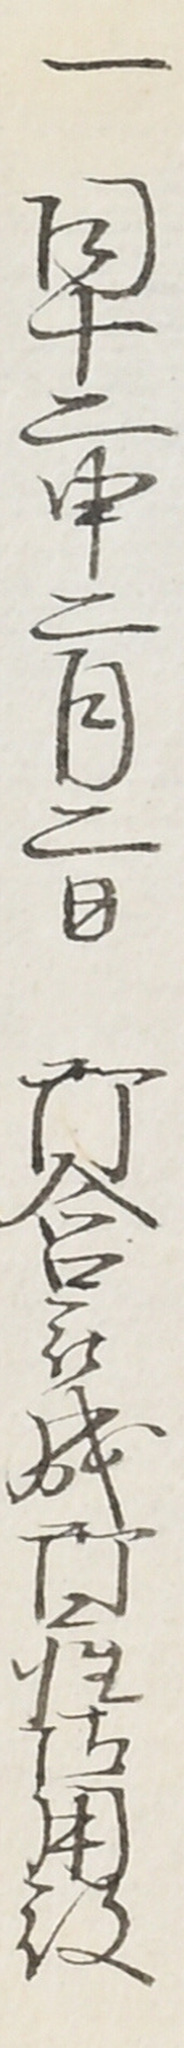一同十二申二月二日御含被成御座御用役
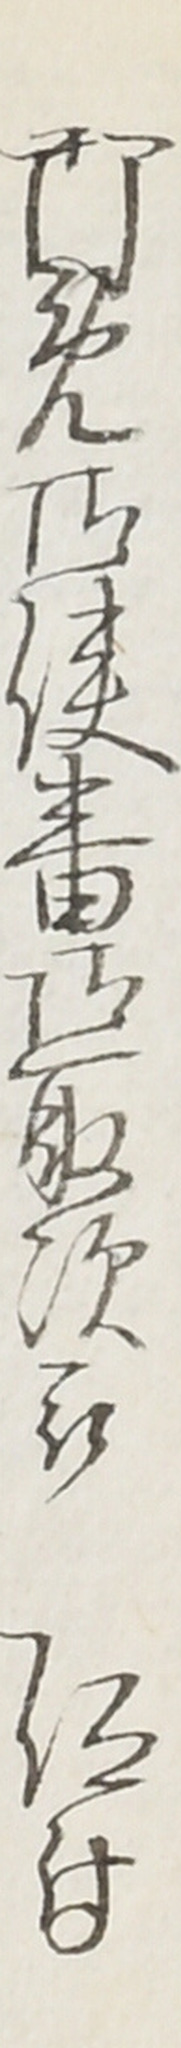御免御使番御取次被仰付
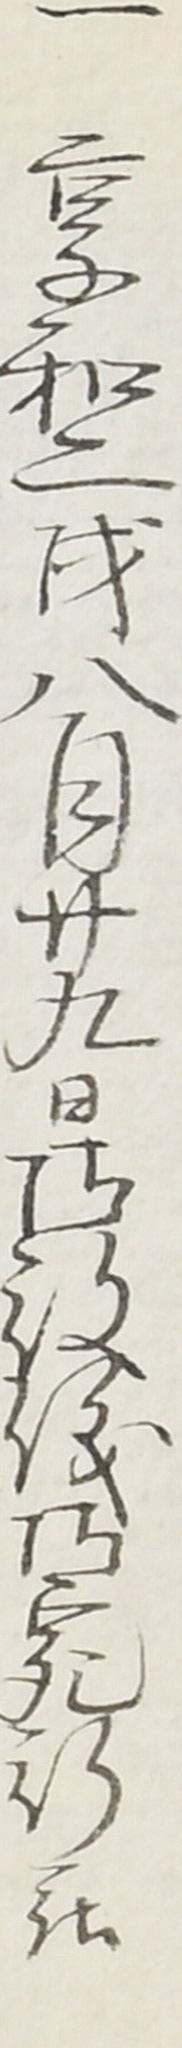一享和ニ戌八月廿九日御役儀御宛行被
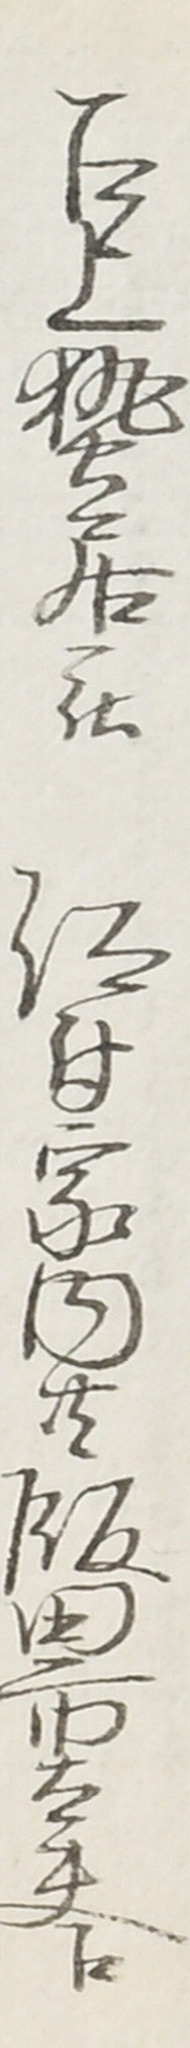召上蟄居被仰付家内共飯田市太夫江
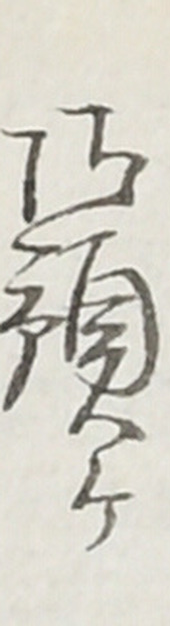御預ヶ
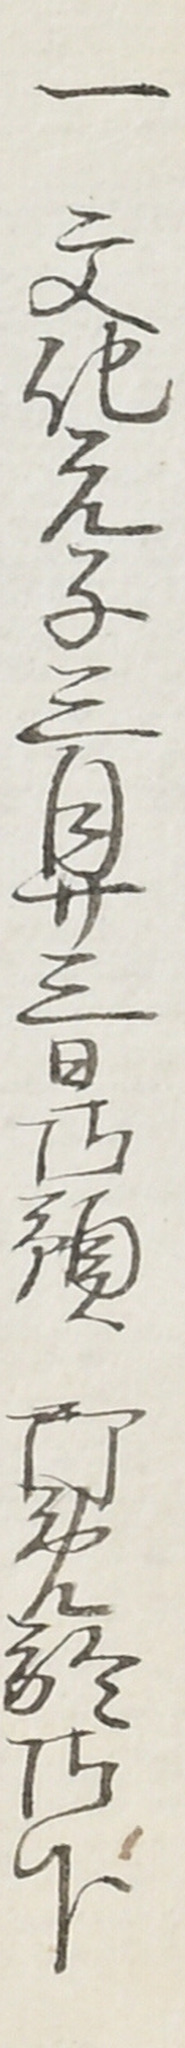一文化元子三月廿三日御預御免於御下
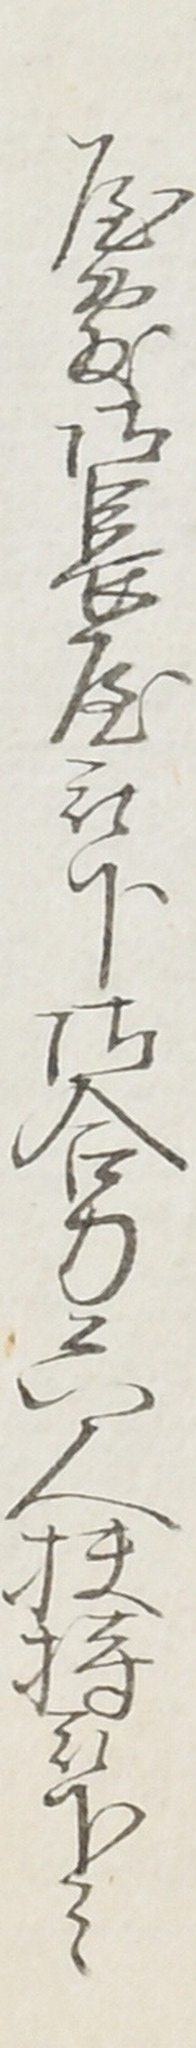屋敷御長屋被下御合力六人扶持被下之
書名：給人諸士勤仕録（七）
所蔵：伊那市立高遠町図書館・合同会社AMANE
